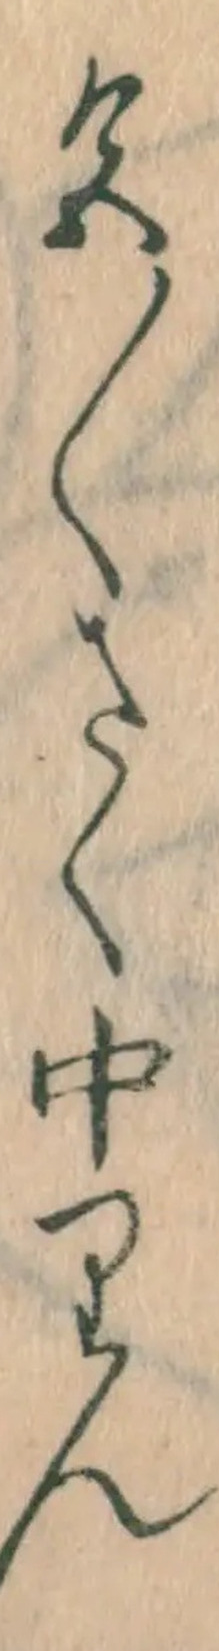色〳〵さく中りん
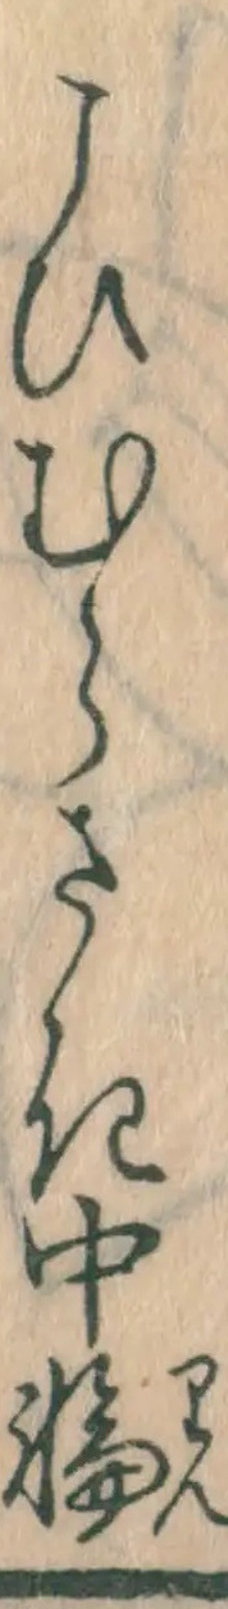こひむらさき中輪
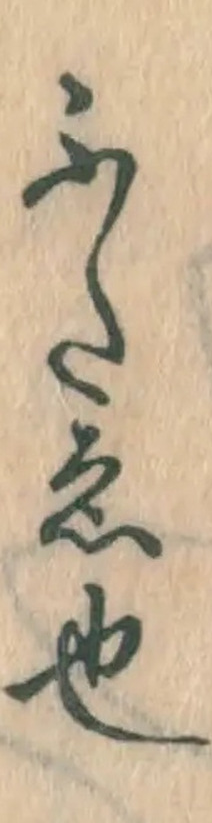ふたゑ也

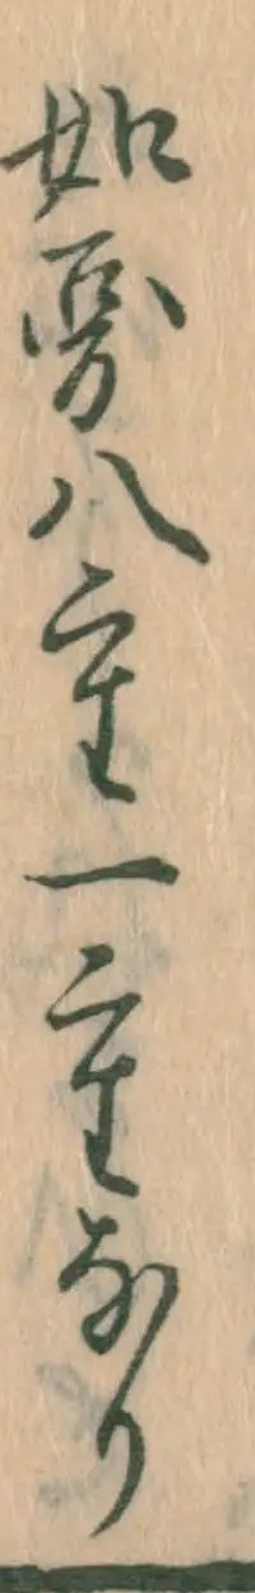如図八重一重なり
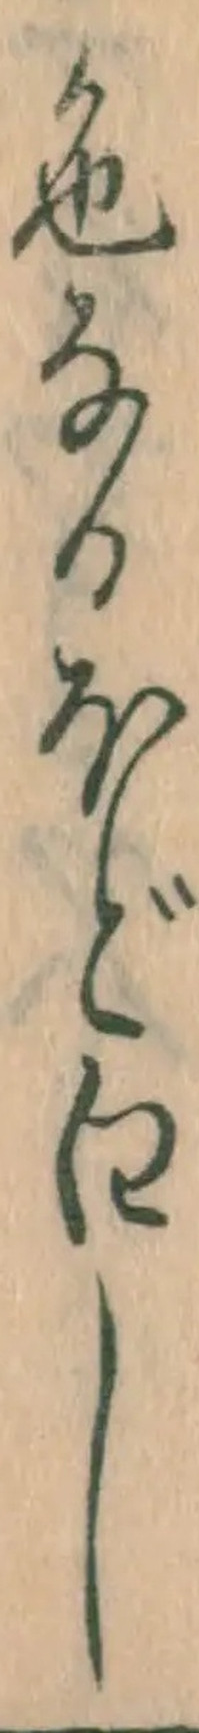色なるほど白し
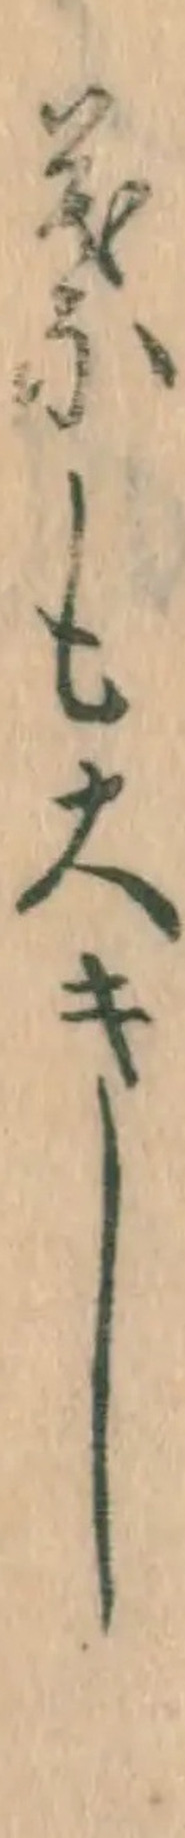葉も大きし
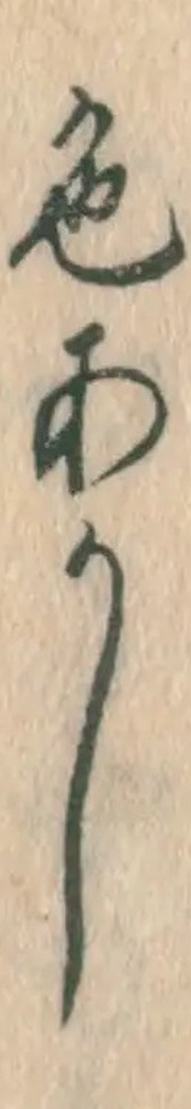色あかし
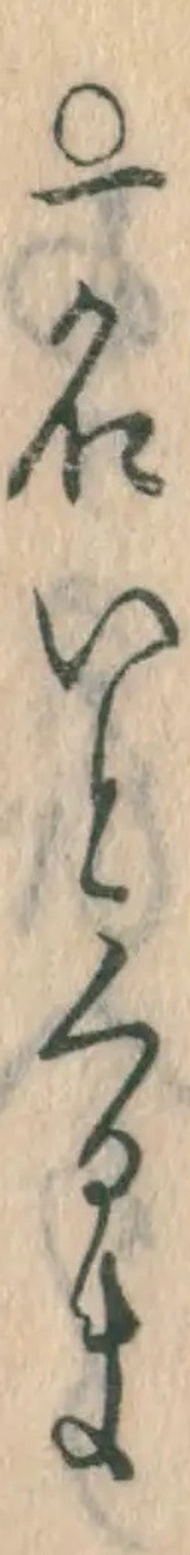○一名いとくるま
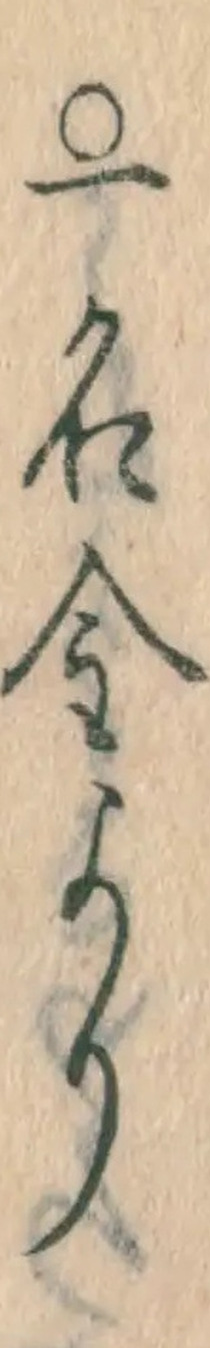○一名金より
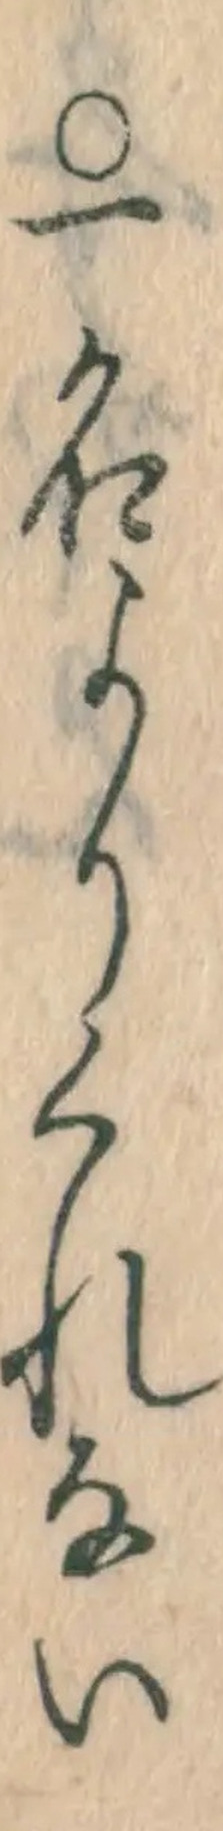○一名よりくれない

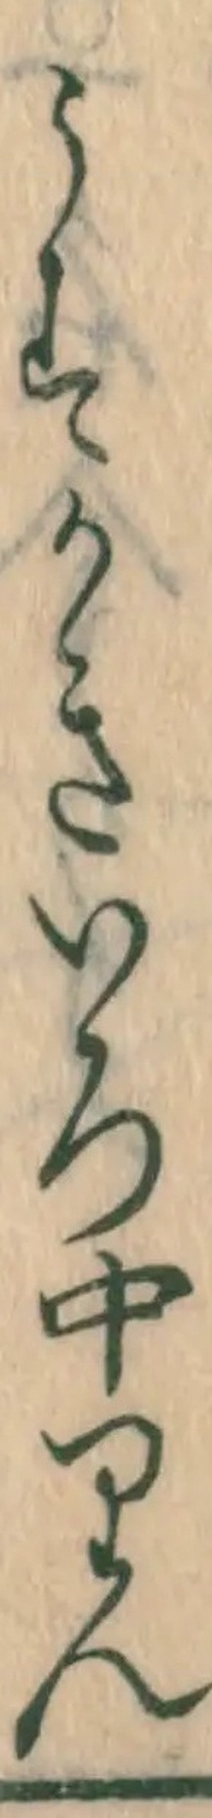うすかきいろ中りん
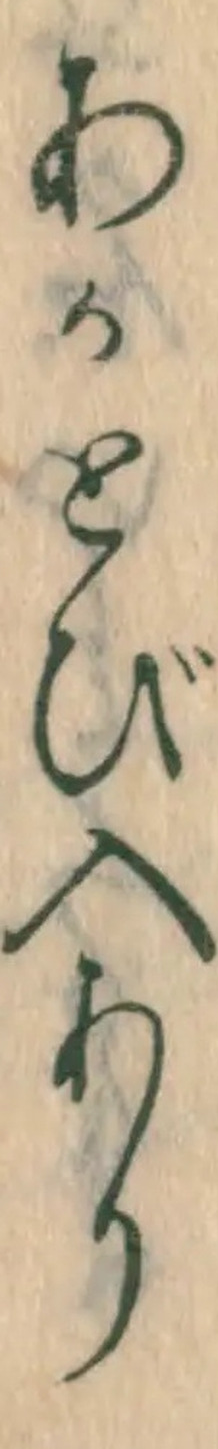あかとび入あり
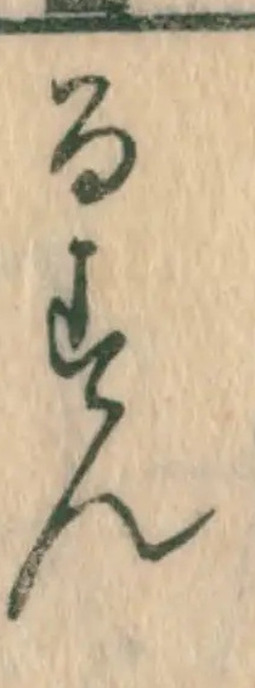るすん
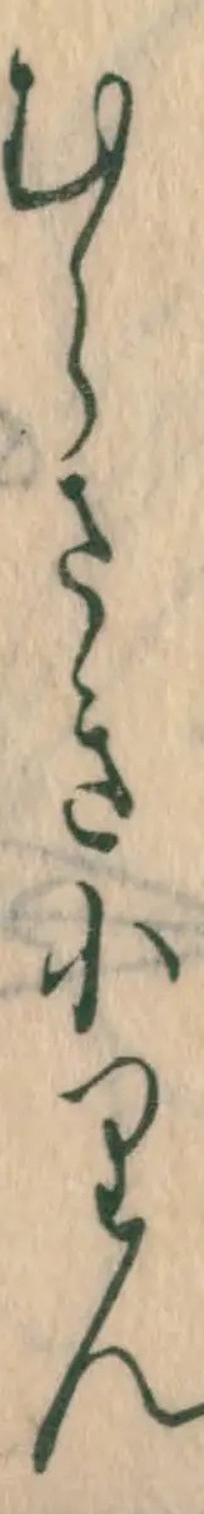むらさき小りん
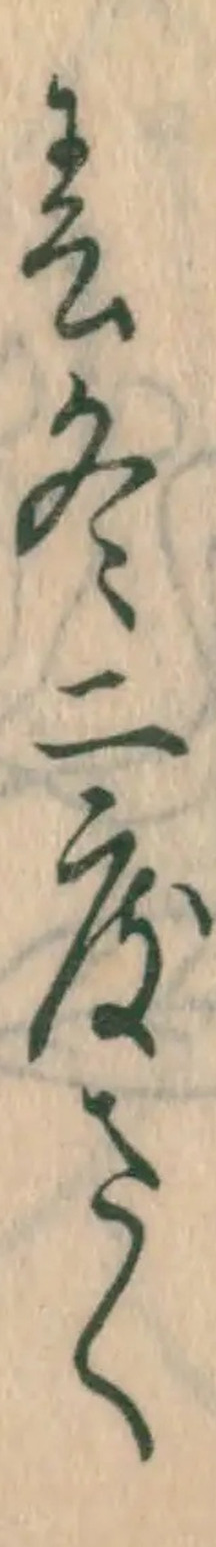春冬二度さく
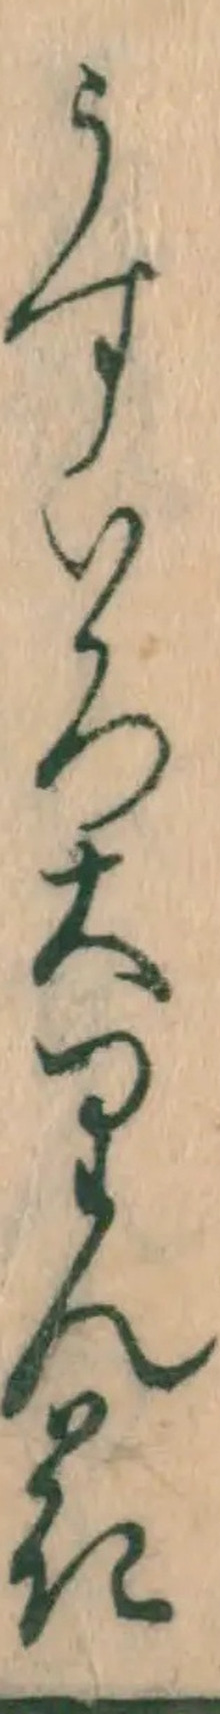うすいろ大りん花
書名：錦繍枕 5巻. [3]
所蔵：国立国会図書館 National Diet Library, JAPAN
